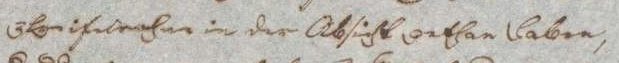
zweifelsohne in der Absicht gethan haben,
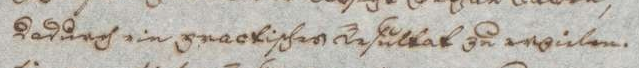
dadurch ein practisches Resultat zu erzielen.
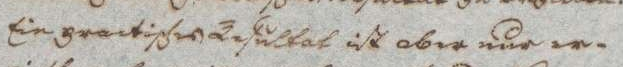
Ein practisches Resultat ist aber nur er-
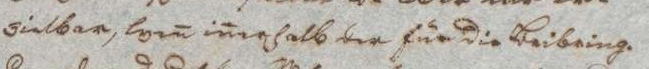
zielbar, wenn innerhalb der für die Beibring-
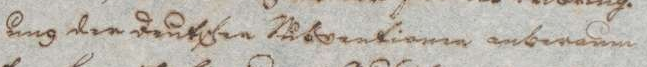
ung der deutschen Subventionen anberaum-
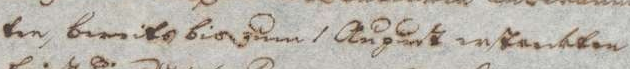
ten, bereits bis zum 1 August erstreckten
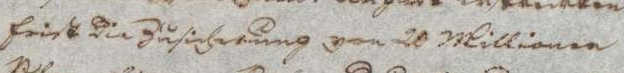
Frist die Zusicherung von 20 Millionen
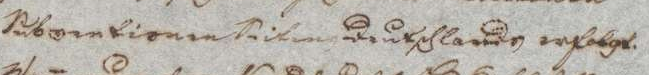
Subventionen Seitens Deutschlands erfolgt.
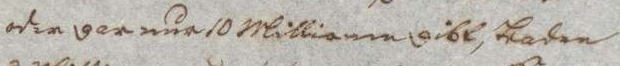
oder gar nur 10 Millionen gibt, Baden
